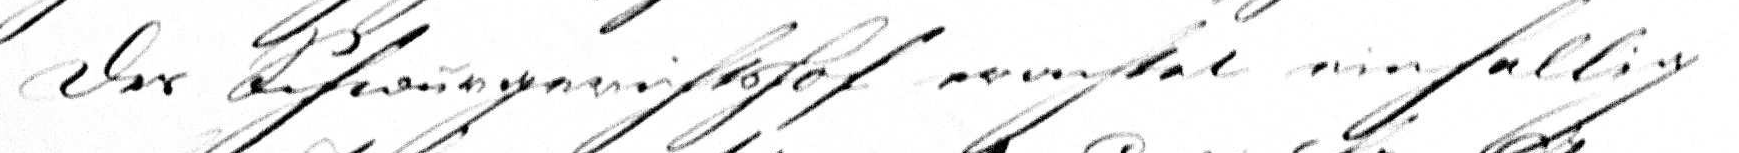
Der Schwurgerichtshof erachtet einhellig
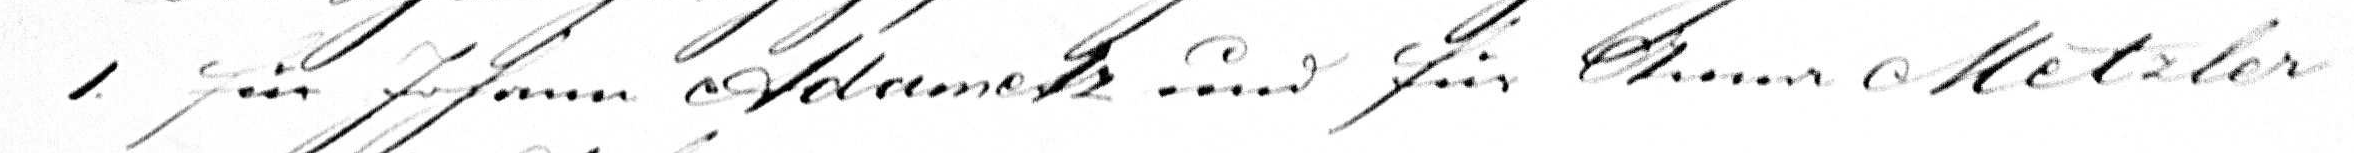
1. für Johann Adametz und für Anna Metzler
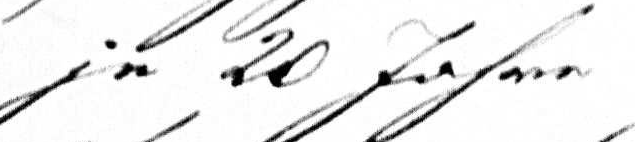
je 20 Jahre
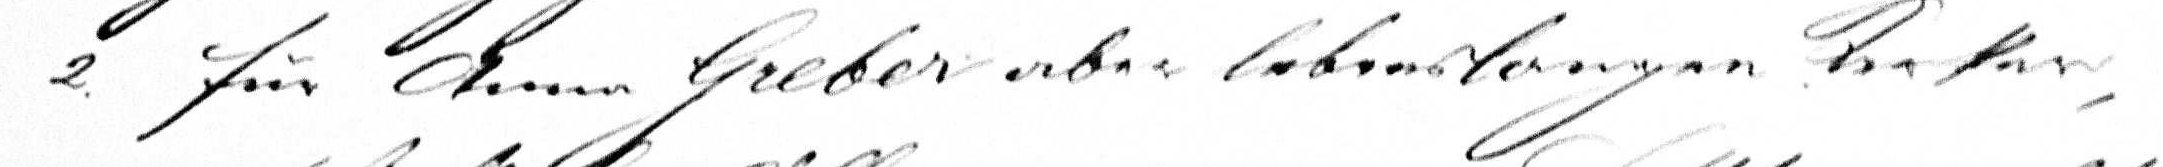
2. für Anna Greber aber lebenslangen Kerker,
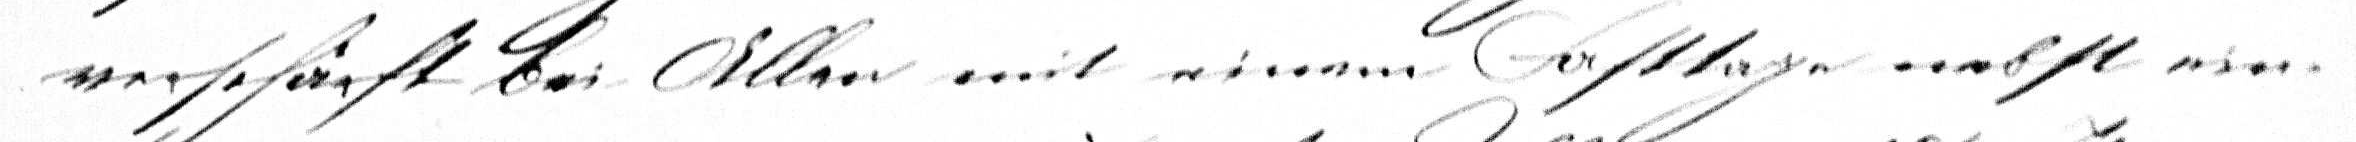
verschärft bei Allen mit einem Fasttage nebst ein¬
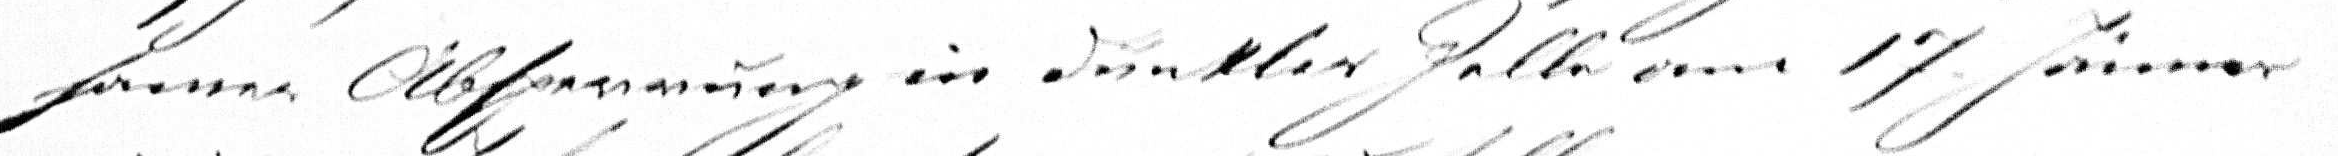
same Absperrung in dunkler Zelle am 17. Jänner
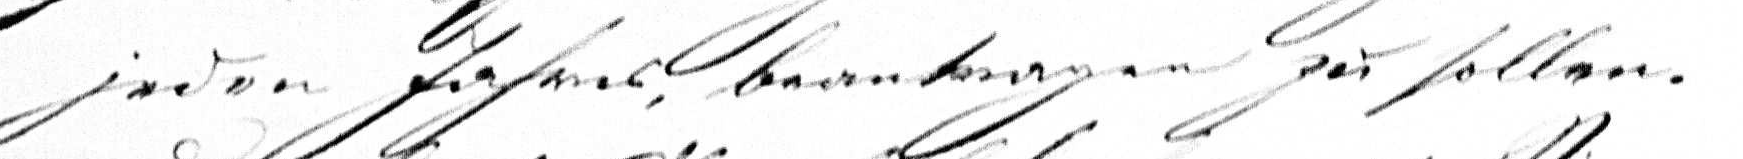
jeden Jahres, beantragen zu sollen
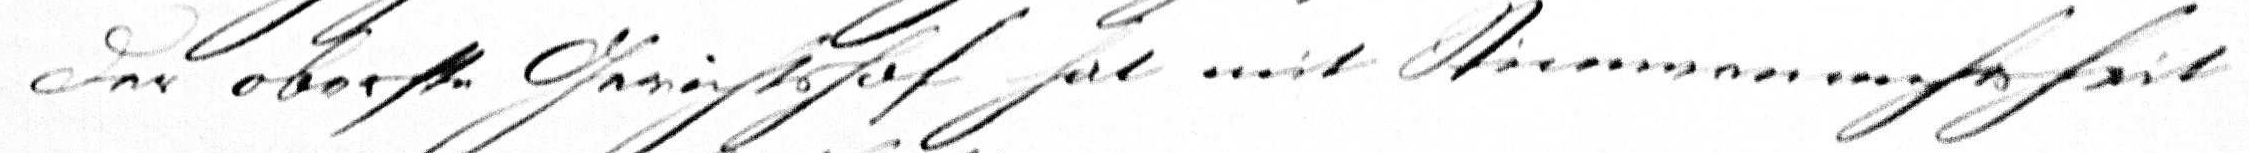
Der oberste Gerichtshof hat mit Stimmendmehrheit
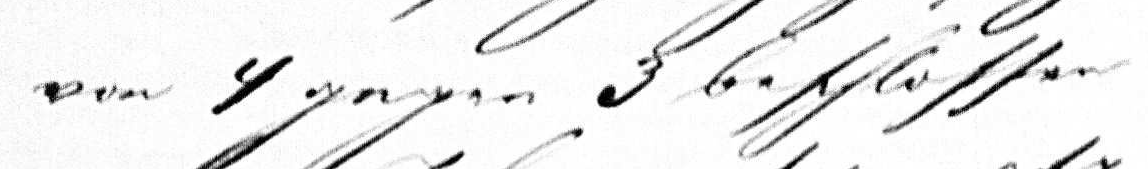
vom 4 gegen 3 beschlossen
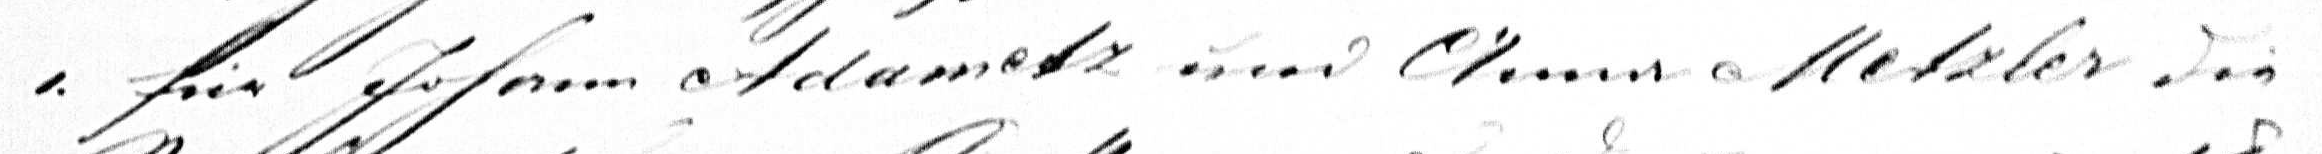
1. für Johann Adametz und Anna Metzler die
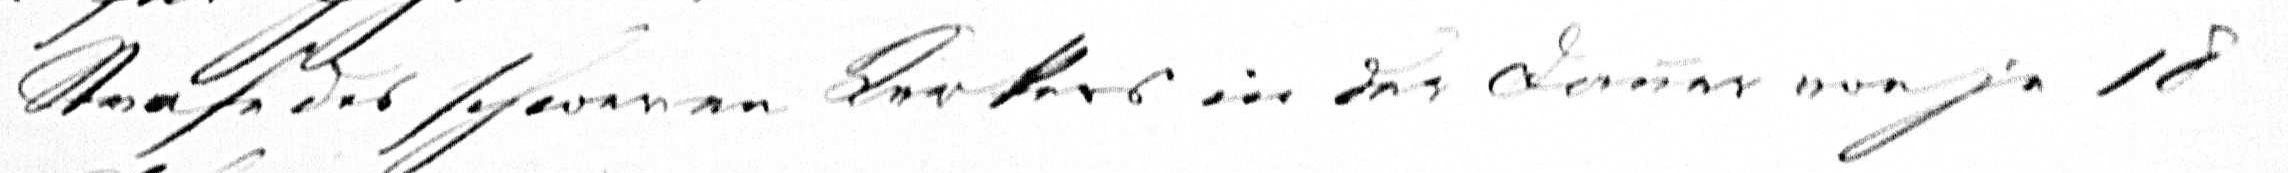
Strafe des schweren Kerkers in der Dauer von je 18
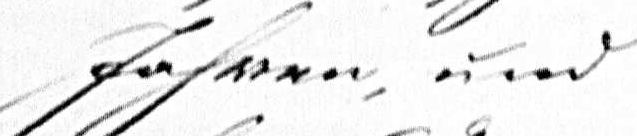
Jahren und
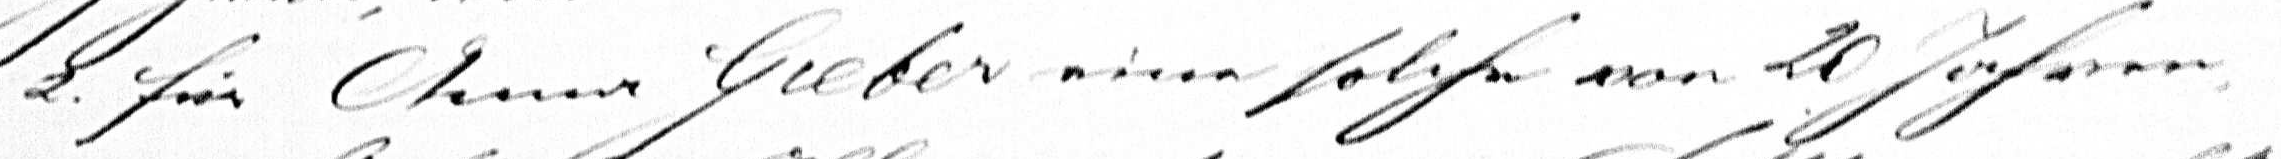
2. für Anna Greber eine solche von 20 Jahren
